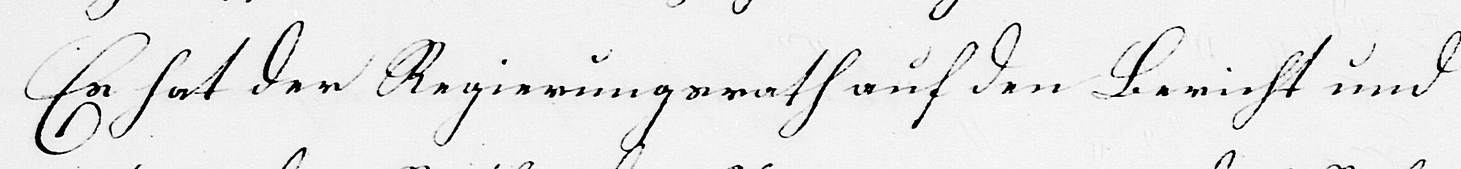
Es hat der Regierungsrath auf den Bericht und
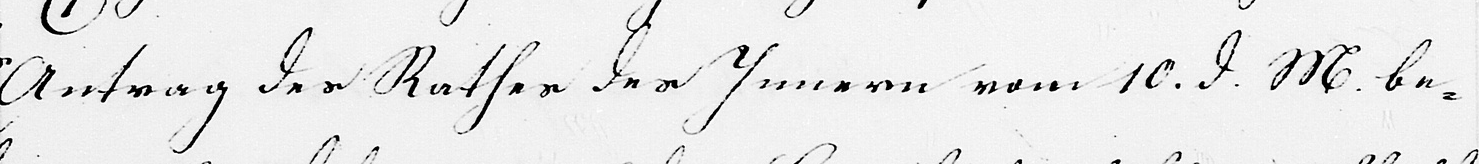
Antrag des Rathes des Innern vom 10. d. M. be¬
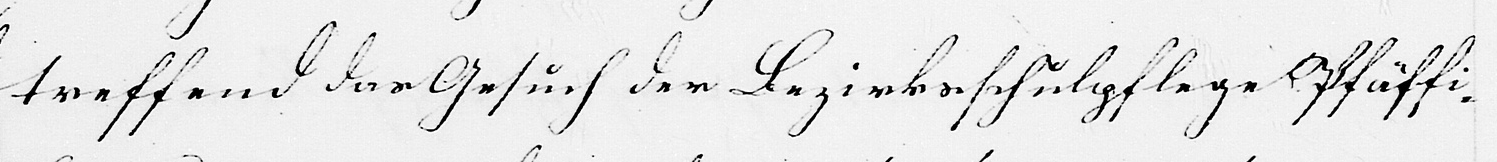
treffend das Gesuch der Bezirksschulpflege Pfäffi¬
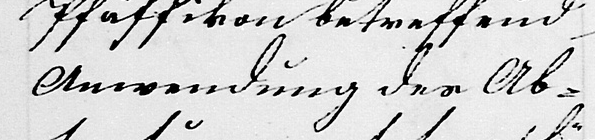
Anwendung des Ab¬
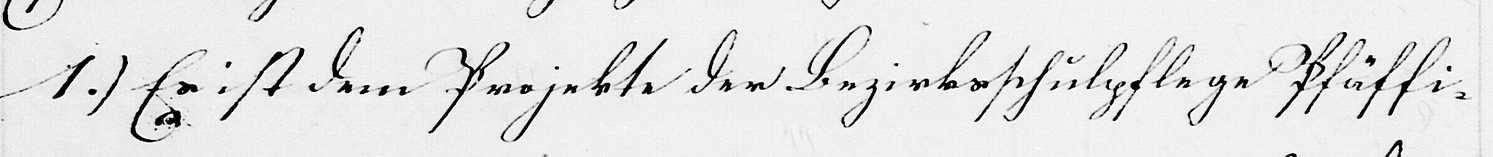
1.) Es ist dem Projekte der Bezirksschulpflege Pfäffi¬
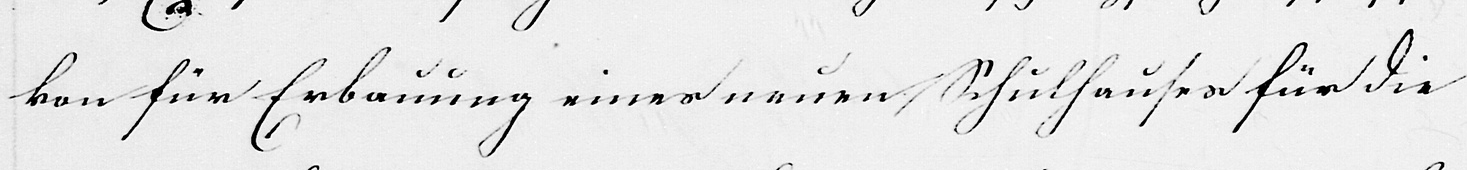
kon für Erbauung eines neuen Schulhauses für die
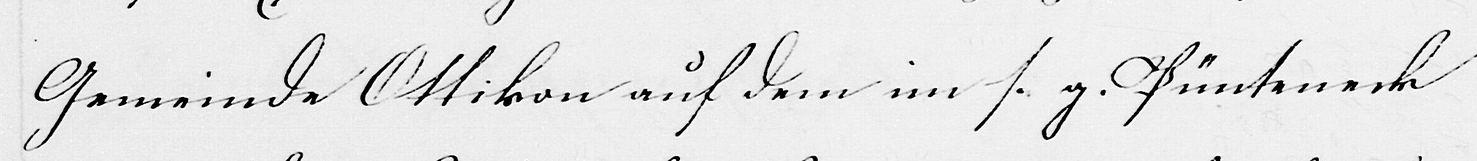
Gemeinde Ottikon auf dem im s. g. Pünteneck
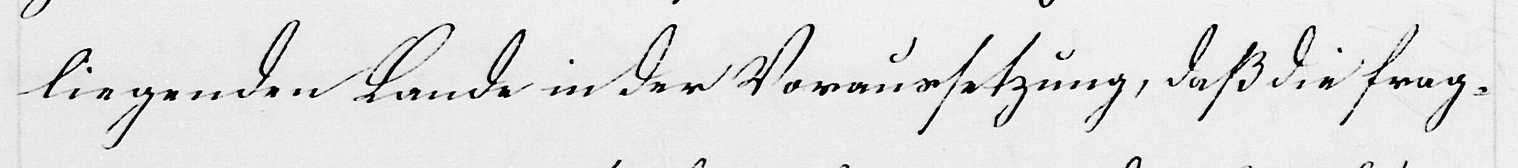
liegenden Lande in der Voraussetzung, daß die frag¬
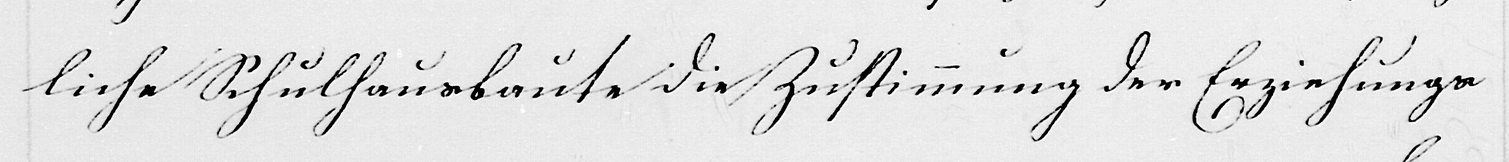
liche Schulhausbaute die Zustimmung der Erziehungs
